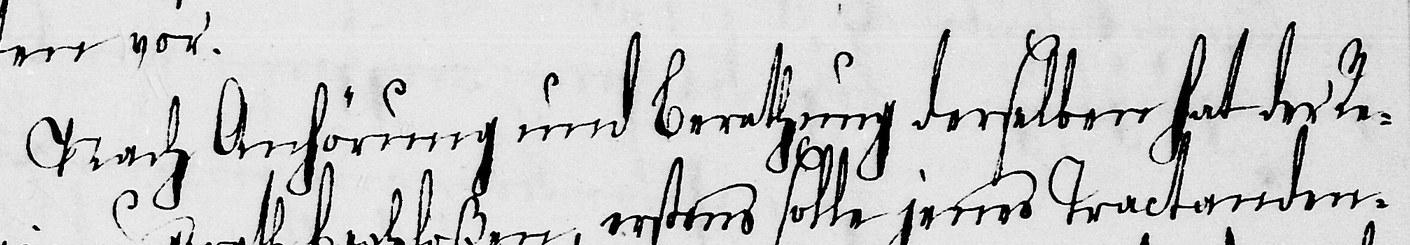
Nach Anhörung und Berathung derselben hat der
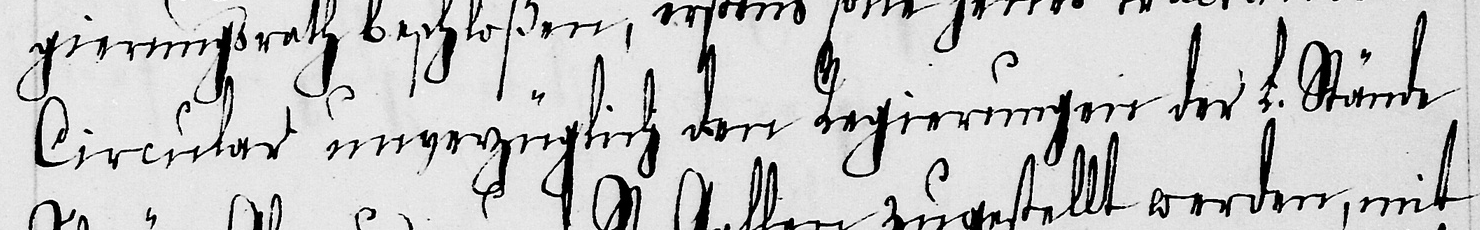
ircular unverzüglich den Regierungen der L. Stände
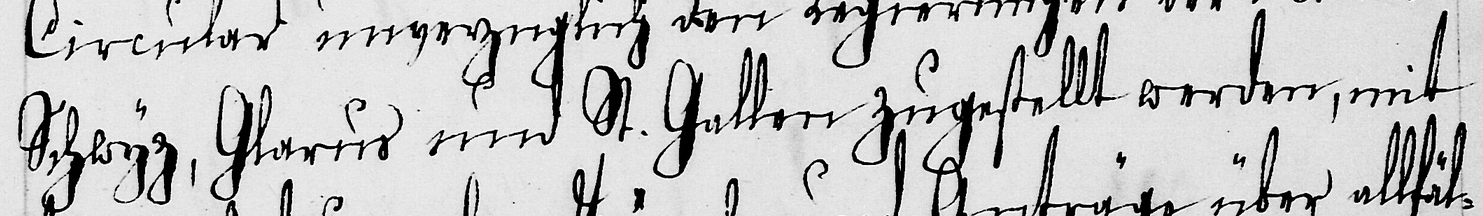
Schwyz, Glarus und St. Gallen zugestellt werden, mit
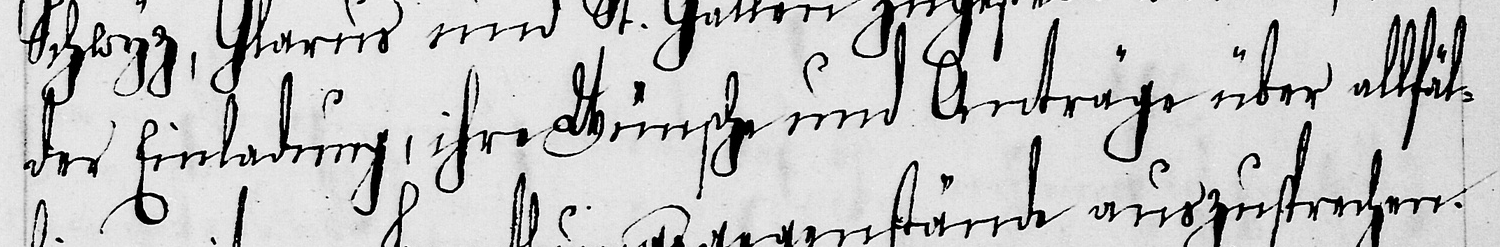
der Einladung, ihre Wünsche und Anträge über allfäl¬
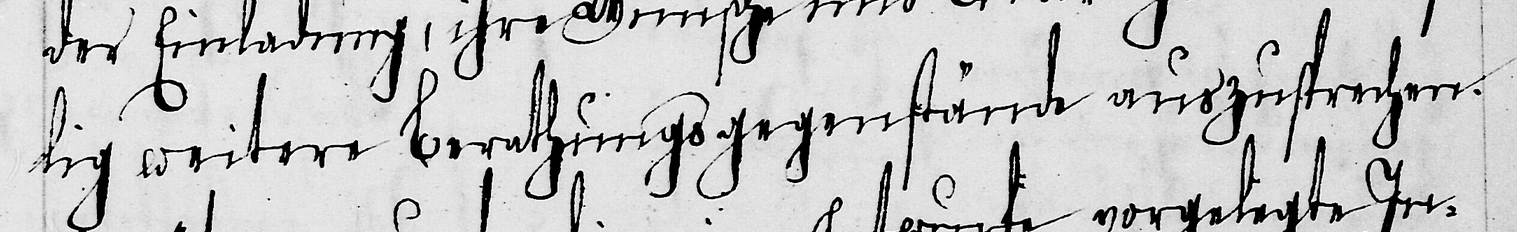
lige weitere Berathungsgegenstände auszusprechen.
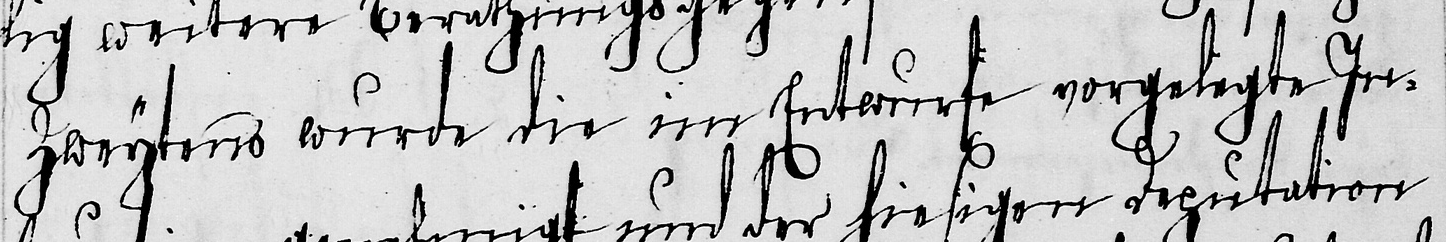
Zweytens wurde die im Entwurfe vorgelegte In¬
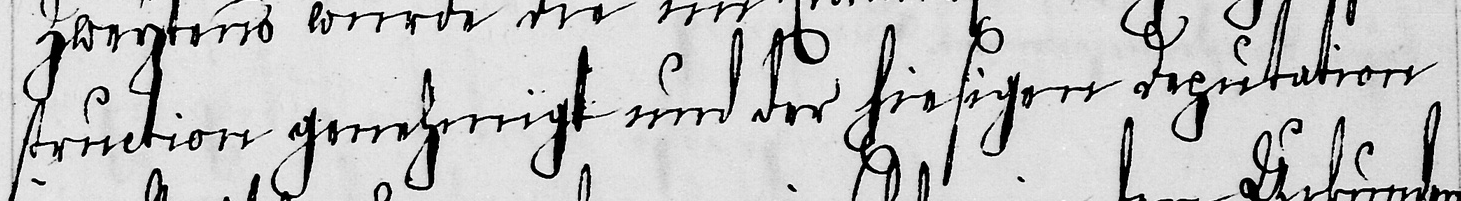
struction genehmigt und der hiesigen Deputation
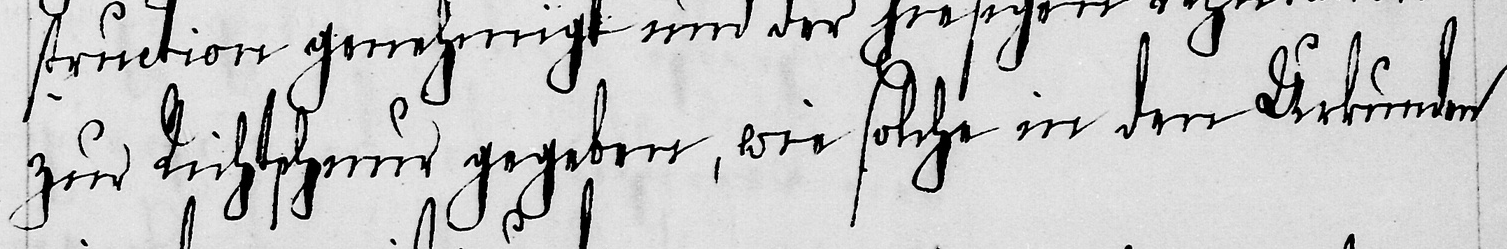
zur Richtschnur gegeben, wie solche in den Urkunden
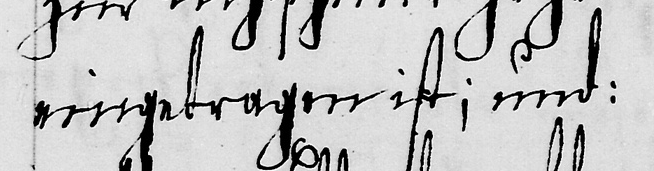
eingetragen ist; und:
